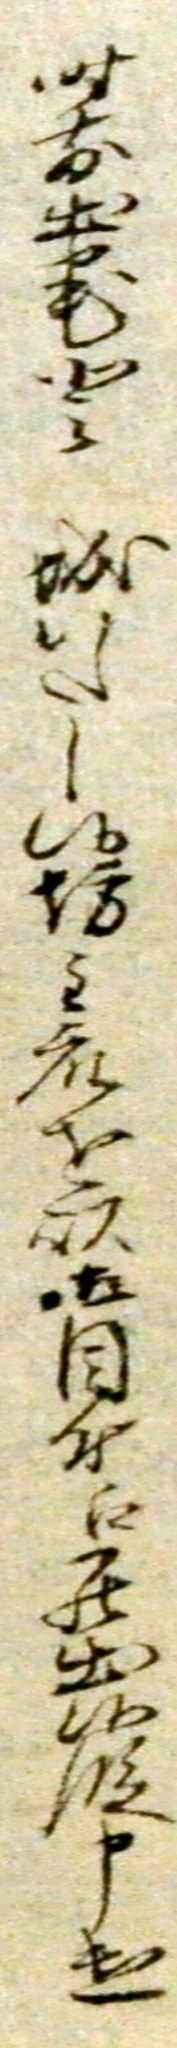時前出宅登城いたし候坊主衆を以御目付江罷出候段申遣
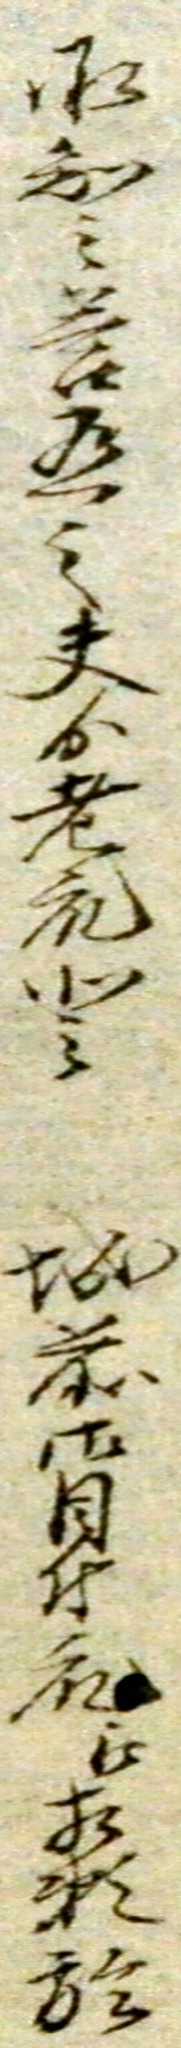承知之答有之夫ゟ老衆登城前御目付衆江相頼於
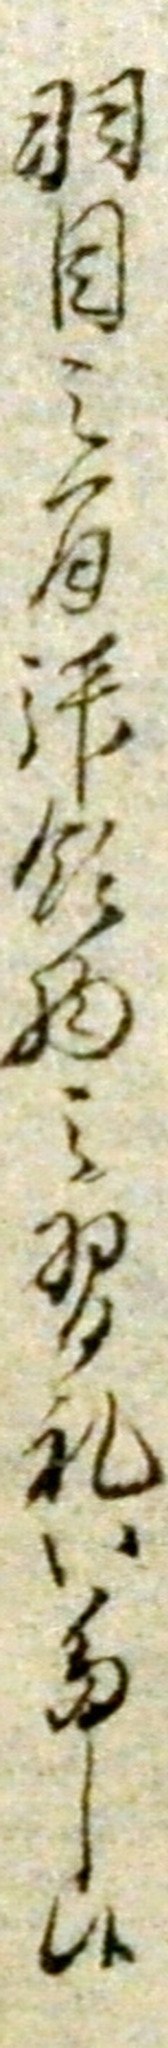羽目之間拝領物之習礼いたし候
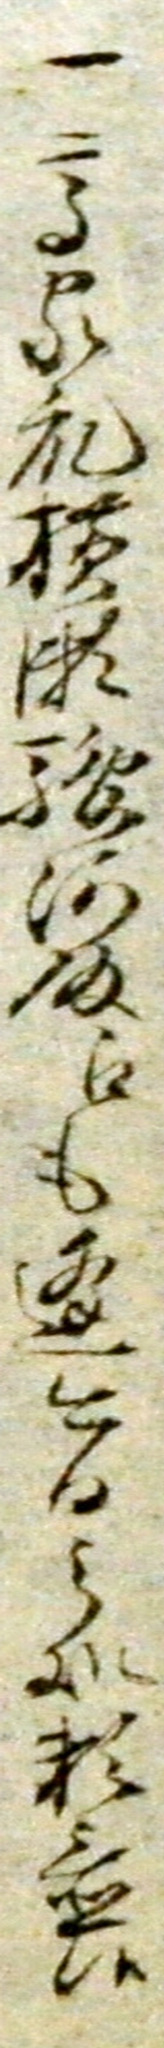一高家衆横瀬駿河殿江も逢今日之処頼置候。

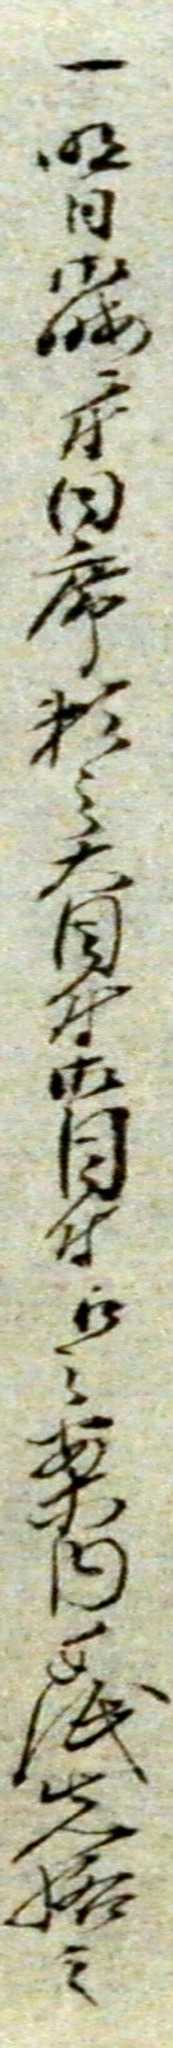一明日御暇ニ付同席頼之大目付御目付江之案内手紙先格之
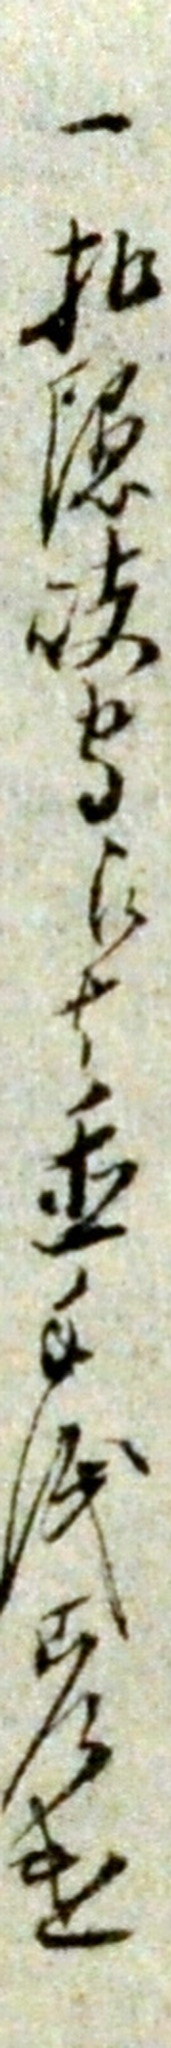一扣隠岐守江者置手紙差遣
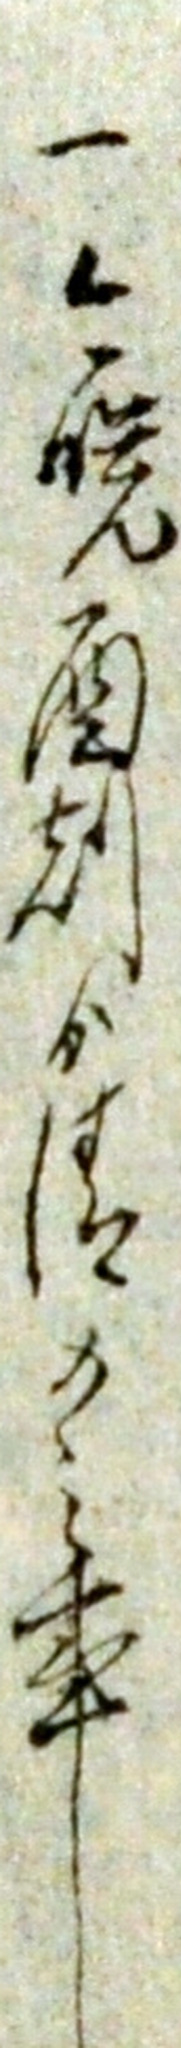一今暁酉刻ゟ清メ之事
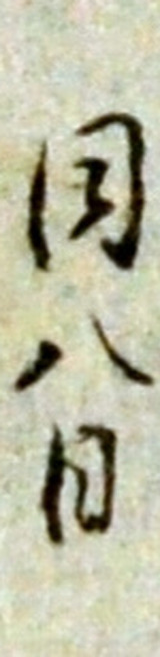同八日
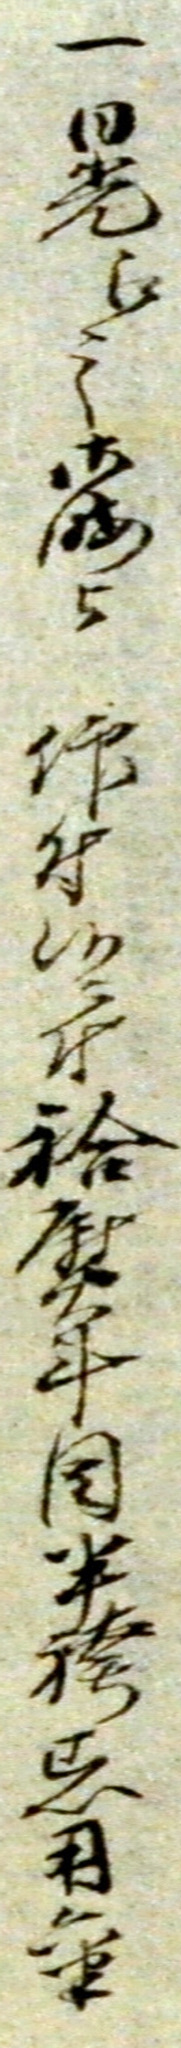一日光江之御暇被仰付候ニ付袷熨斗目半袴着用
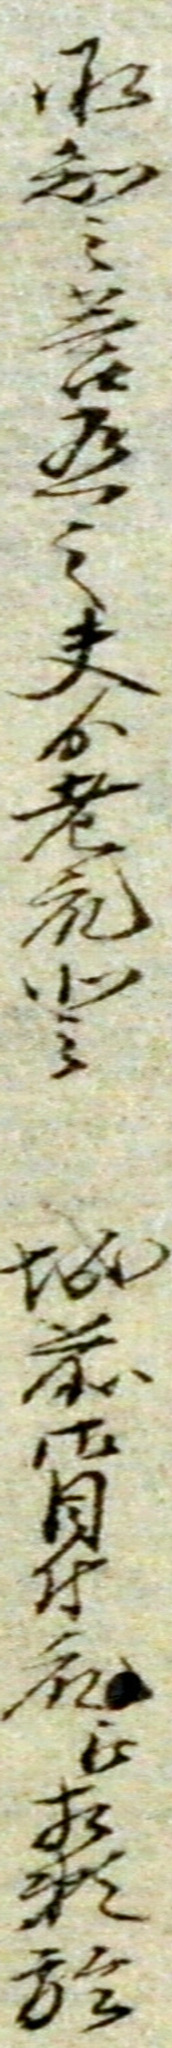承知之答有之夫ゟ老衆登城前御目付衆江相頼於
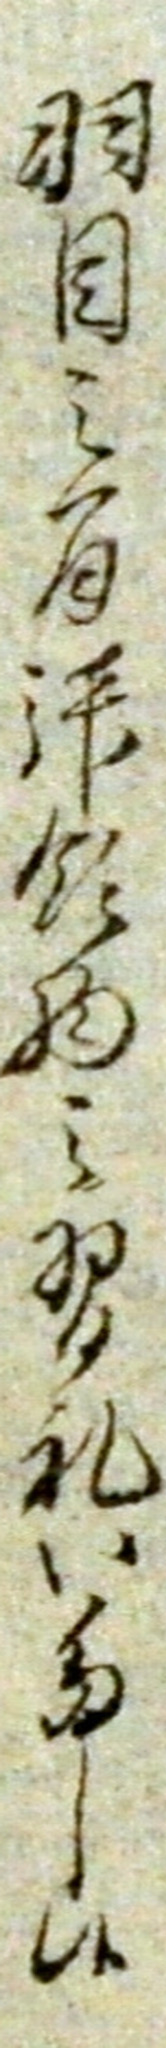羽目之間拝領物之習礼いたし候
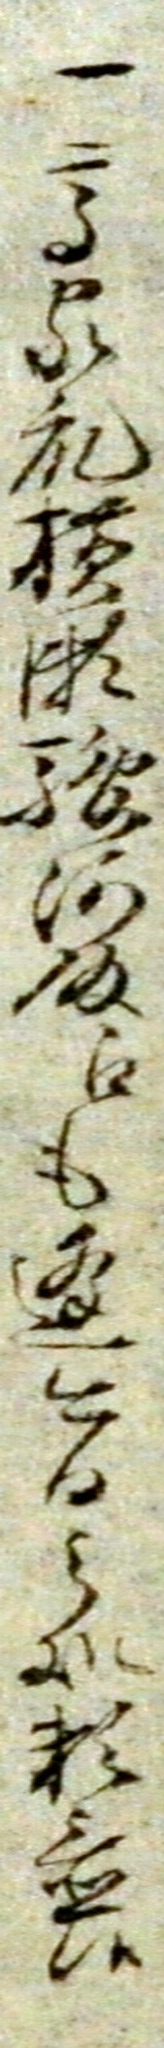一高家衆横瀬駿河殿江も逢今日之処頼置候
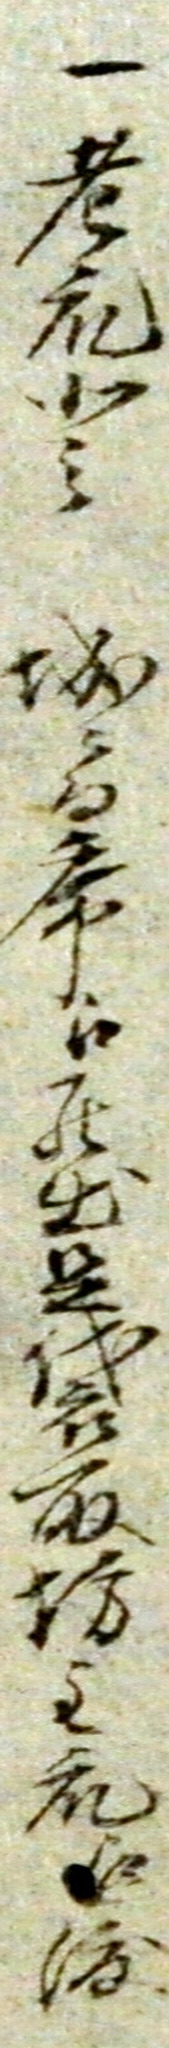一老衆登城ニ而席江罷出足袋取坊主衆江渡
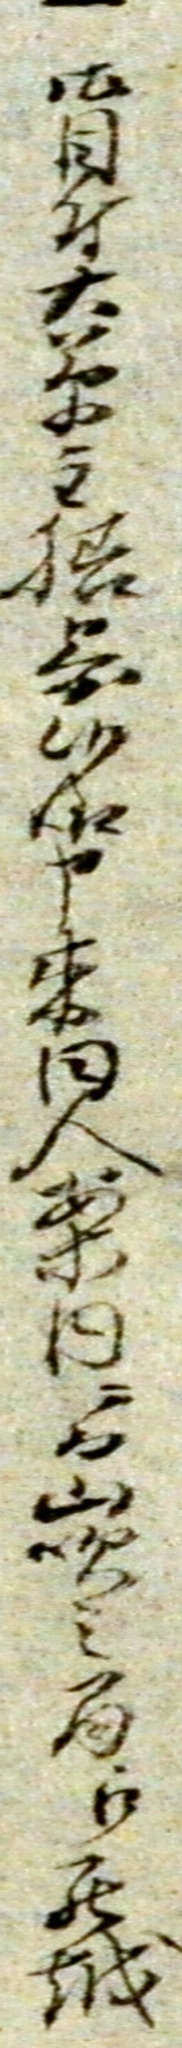一御目付大草主膳寄候様申来同人案内ニ而山吹之
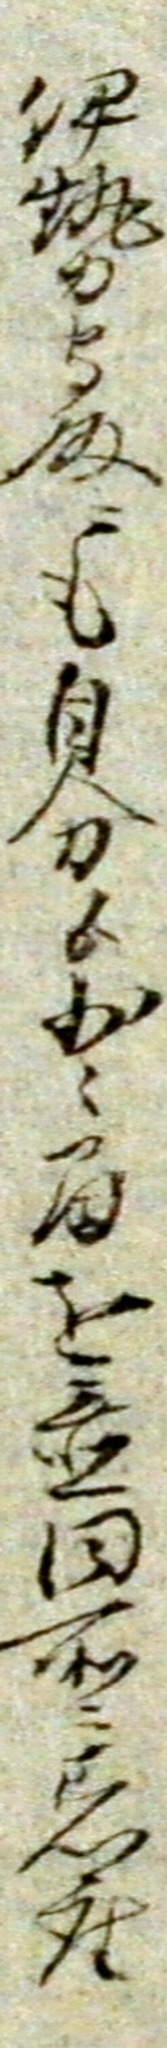伊勢守殿ニも自分ゟ少々間を置同所ニ着座
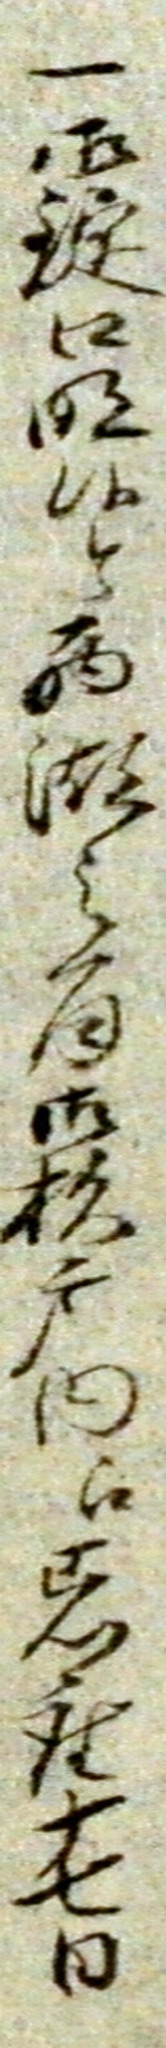一御錠口明候と西湖之間御杉戸内江着座十七日
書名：日光御名代相勤候節ノ留
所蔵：伊那市立高遠町図書館・合同会社AMANE
